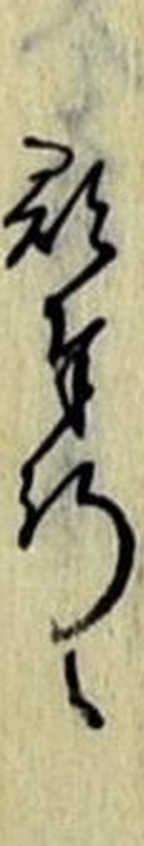郡奉行へ
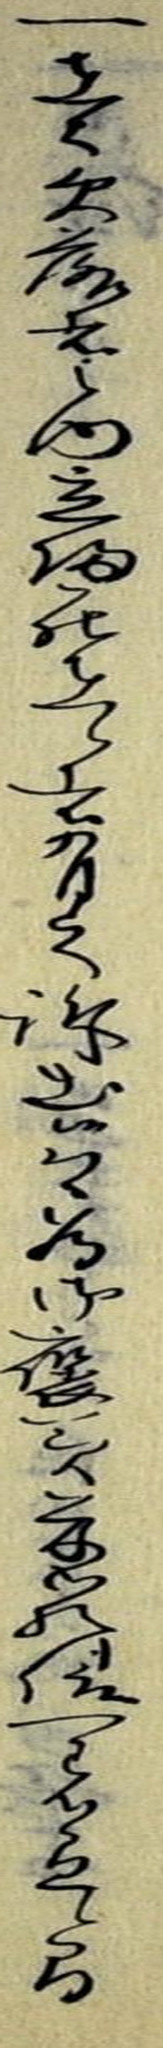一在々欠落者之内立帰罷在候者有之訴出候はゝ為褒美米弐拾俵可被下置候間
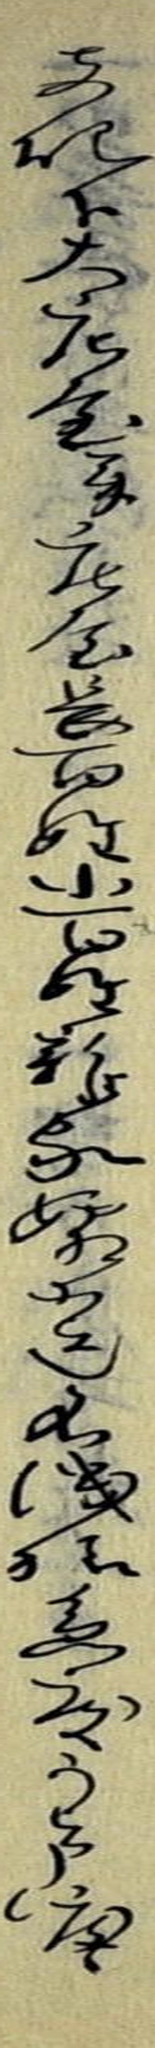支配下大庄屋并庄屋長百姓小百姓雑家孀等迄不洩様急度可被申渡候
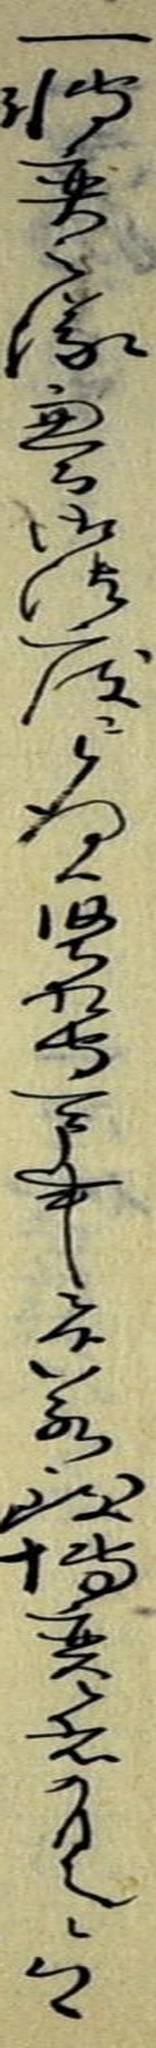一博奕之儀兼而御法度に候得は堅相守可申事に候若致博奕候者有之候はゝ
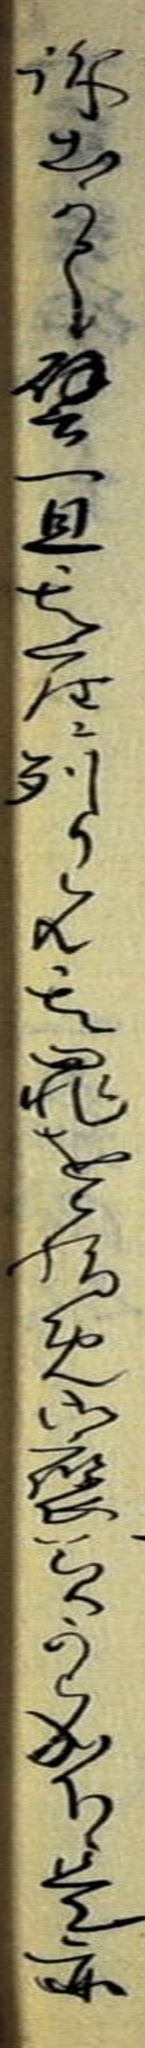訴出可申之候譬一旦其座に列り候共其罪を被指免御褒美可被成下候是亦
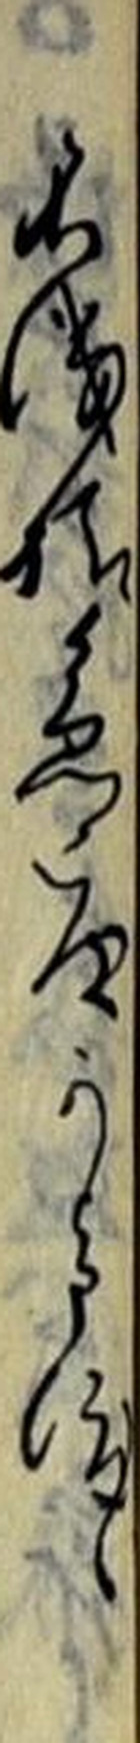不洩様急度可被申渡候
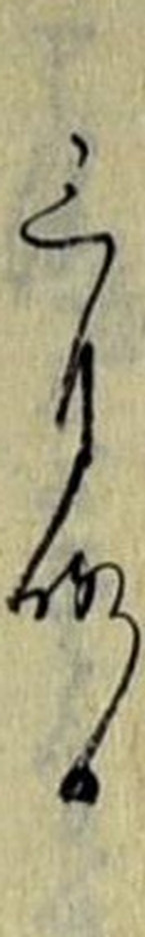三月晦日
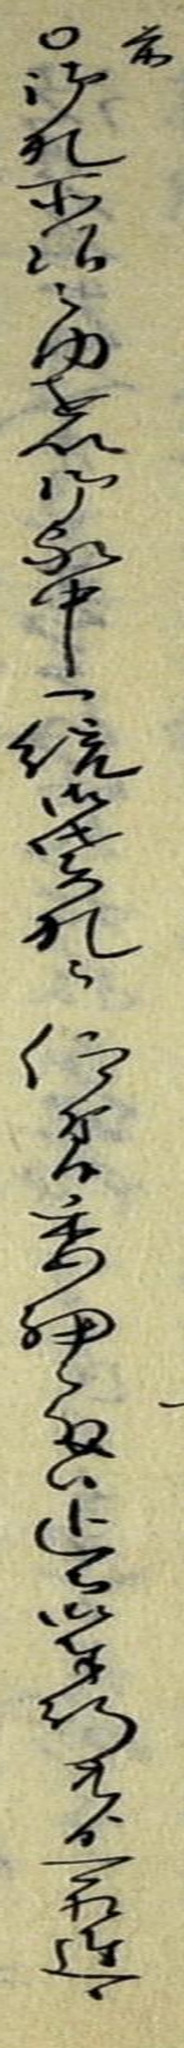〇御札所銀之内を以御家中一統御貸札被仰付候委細之義は追而御奉行共ゟ可相達候
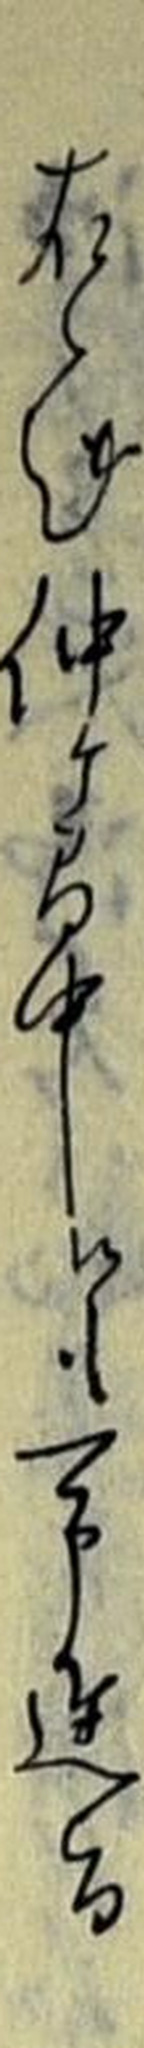右之趣仲ケ間中えも可申達旨
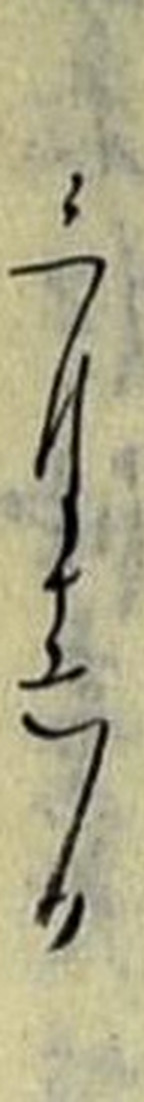三月十六日
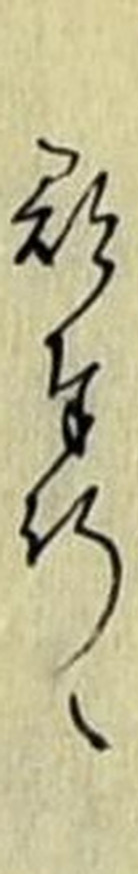郡奉行へ
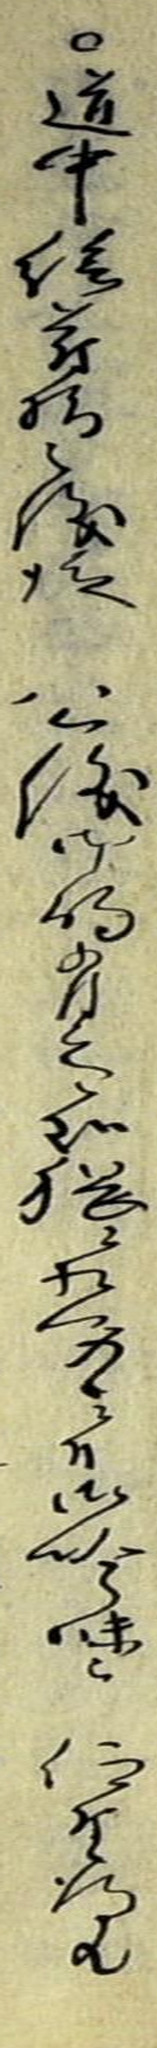〇道中絵符指之儀従公儀御触有之候処猥に相聞候に付御吟味被仰付候得共
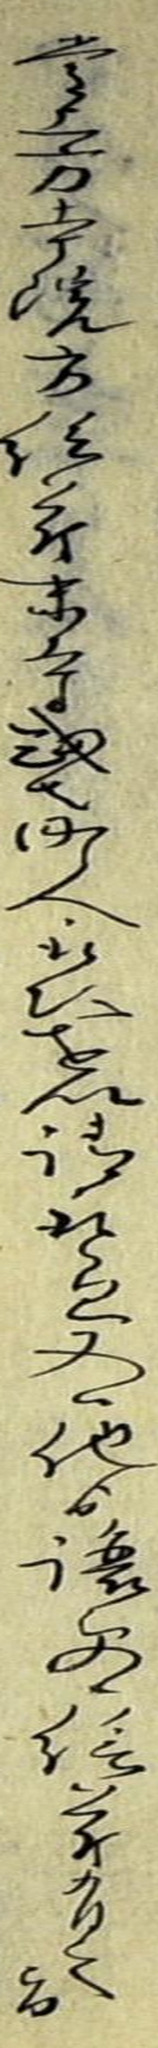堂上方寺院方絵符末寺或は町人取次を以請取置又は他ゟ譲受候絵符有之旨
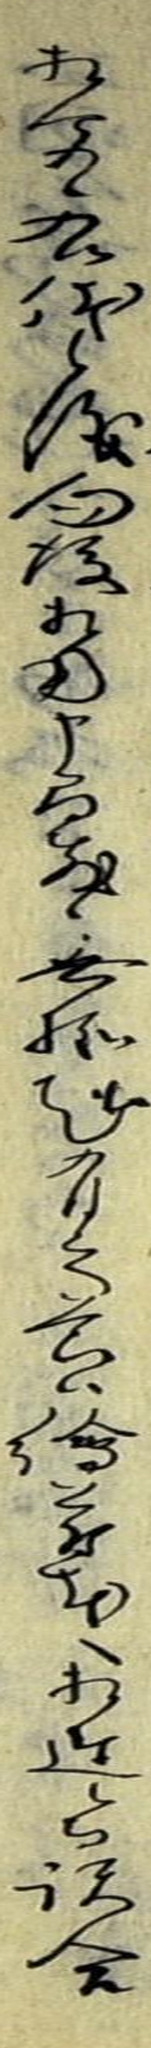相聞候右体之儀向後相用申間敷候無拠趣有之節は絵符本へ相達候而訳合
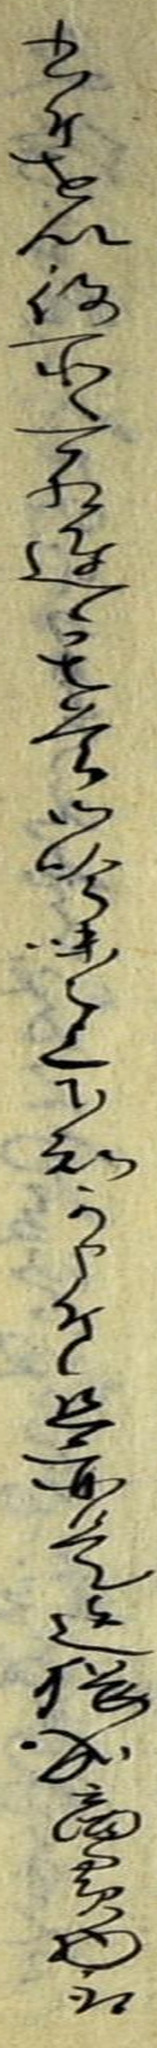書付を以役所へ可相達候其節御吟味之上下知可申付候且亦是迄猥成商買物取

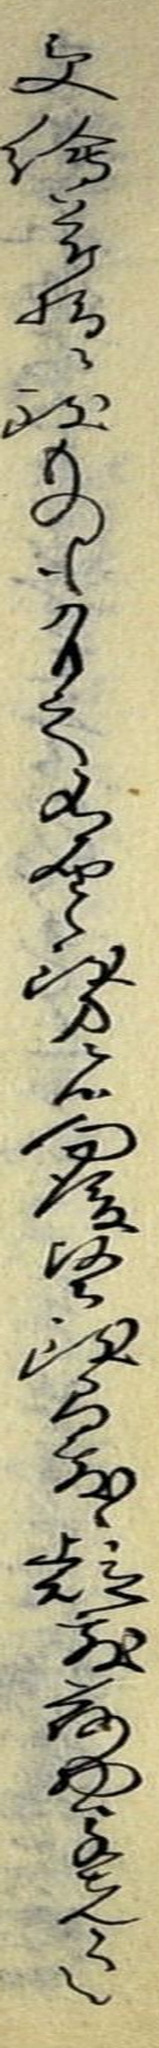受絵符指に致ものも有之不届之致方に候向後堅致間敷候疑敷荷物は手先々之
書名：命令之部 二
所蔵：福井県文書館 Fukui Prefectural Archives
